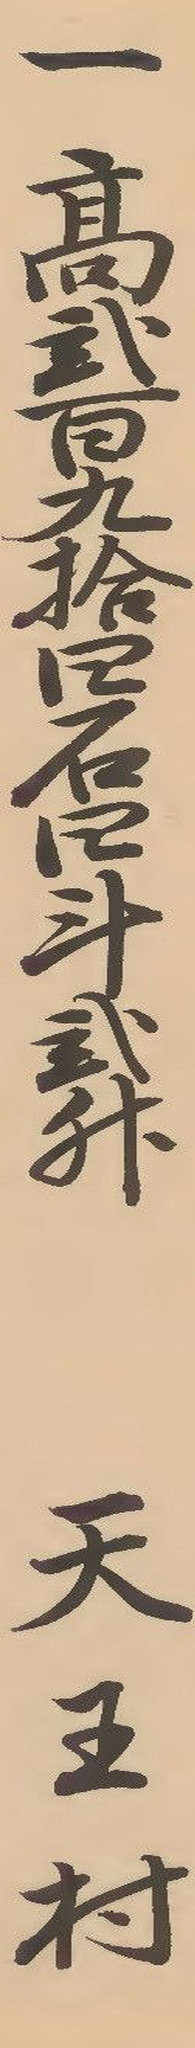一高弐百九拾四石四斗弐升天王村
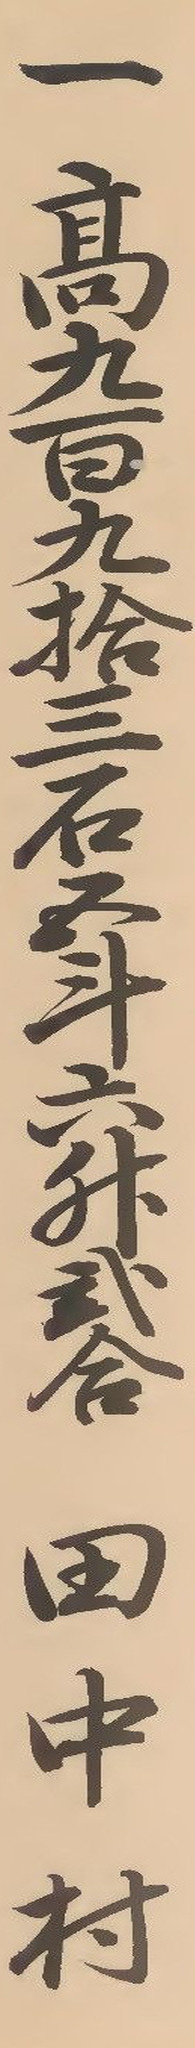一高九百九拾三石五斗六升弐合田中村
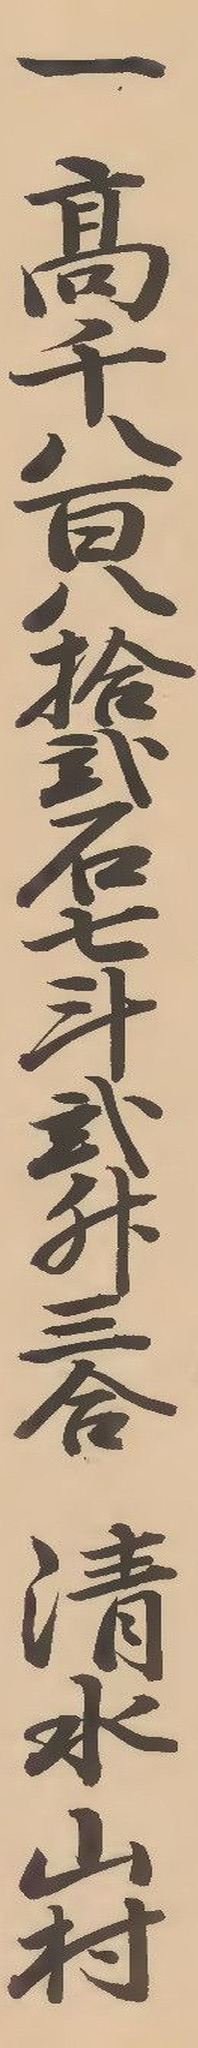一高千八百八拾弐石七斗弐升三合清水山村
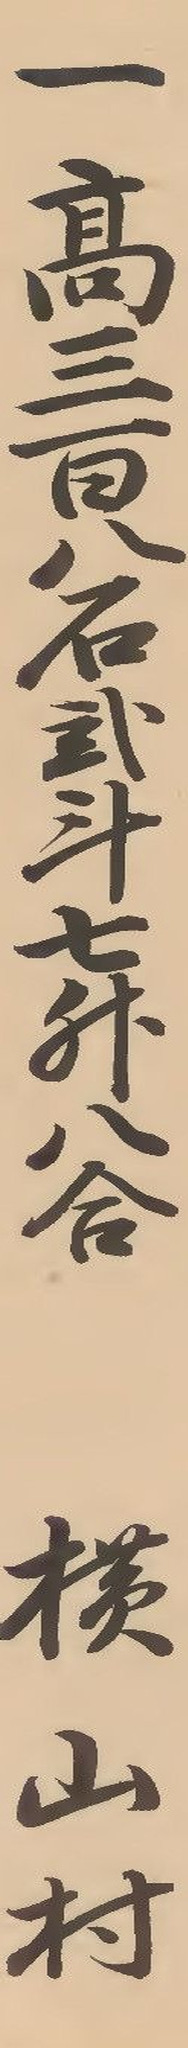一高三百八石弐斗七升八合横山村
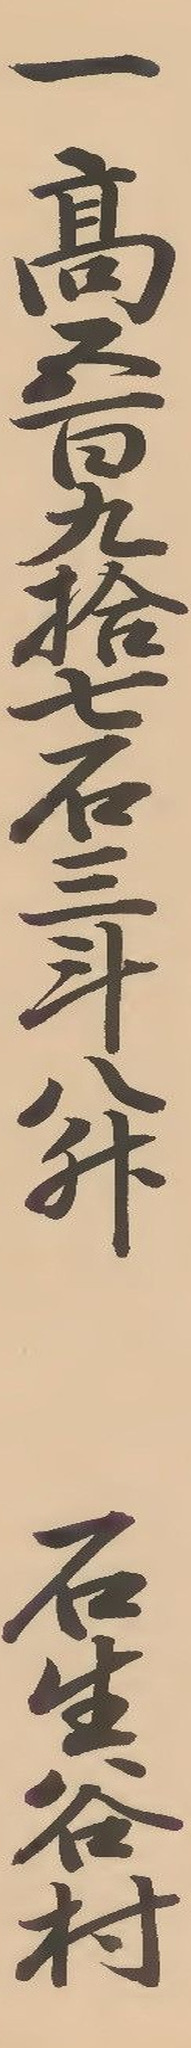一高五百九拾七石三斗八升石生谷村

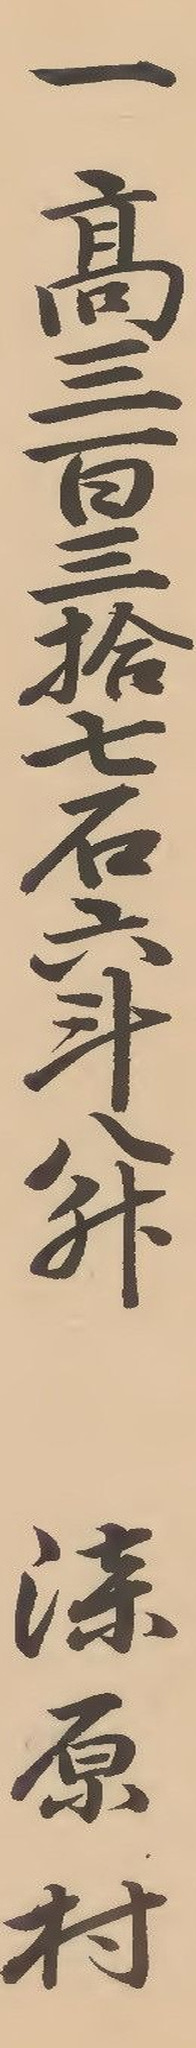一高三百三拾七石六斗八升漆原村
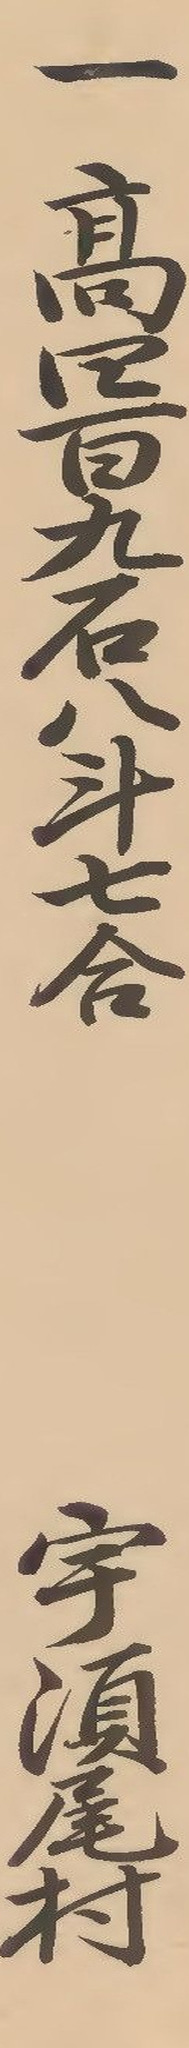一高四百九石八斗七合宇須尾村
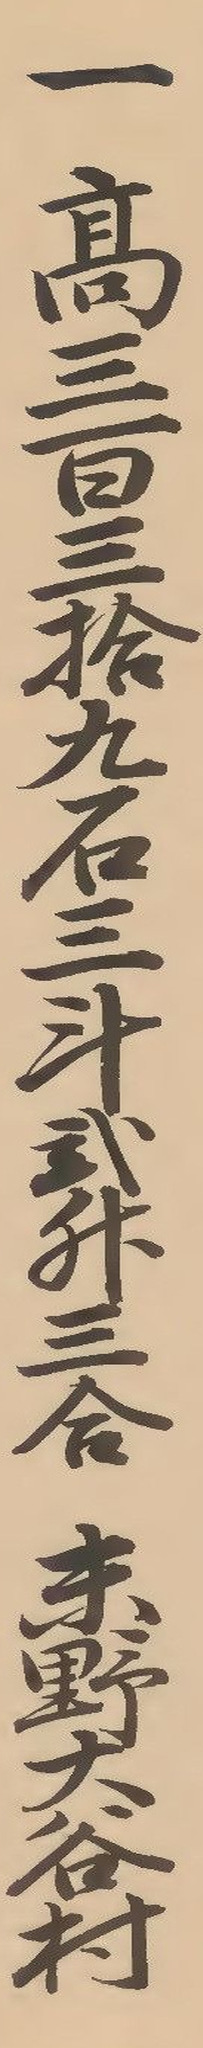一高三百三拾九石三斗弐升三合末野大谷村
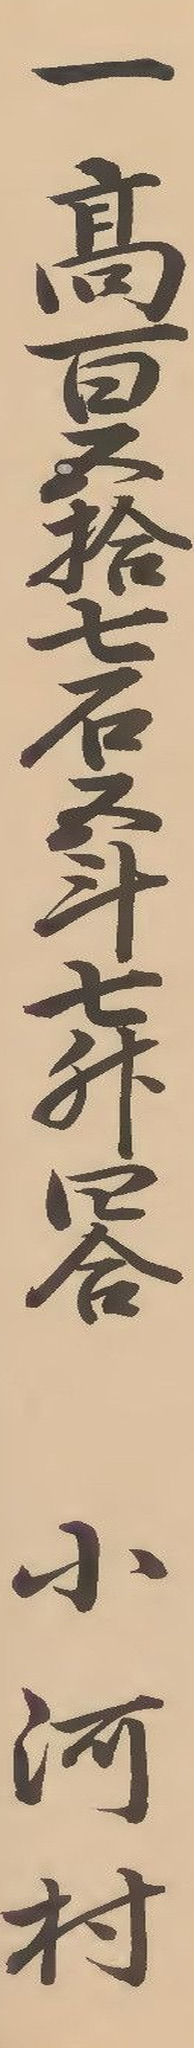一高百五拾七石五斗七升四合小河村
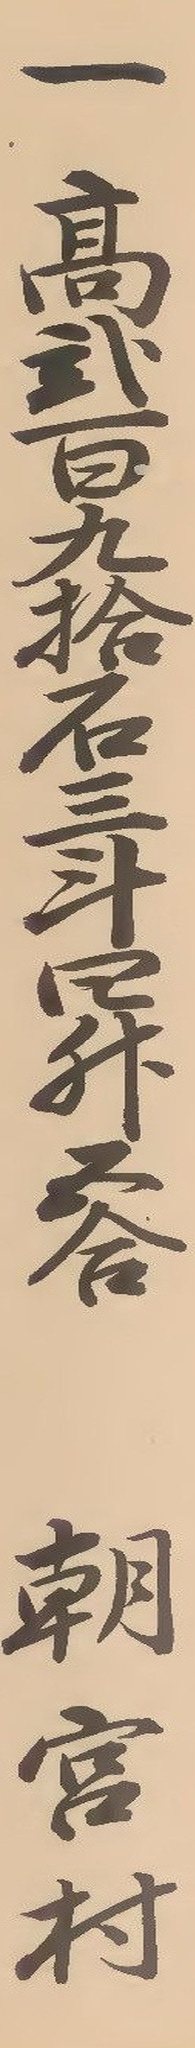一高弐百九拾石三斗四升五合朝宮村
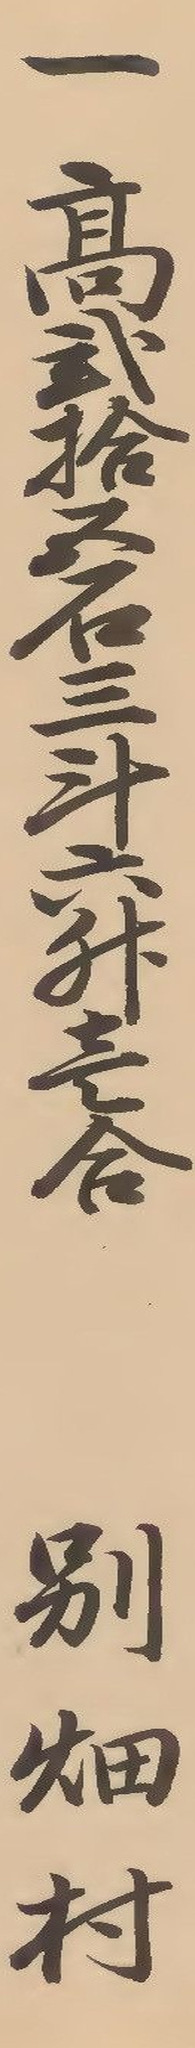一高弐拾五石三斗六升壱合別畑村
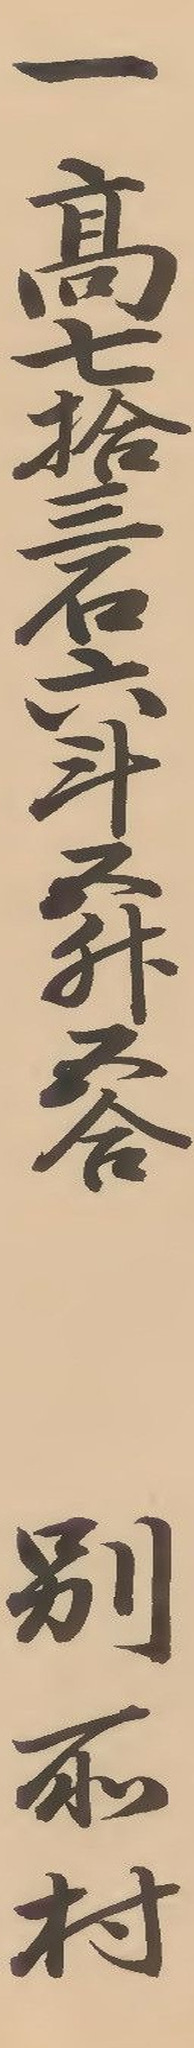一高七拾三石六斗五升五合別所村
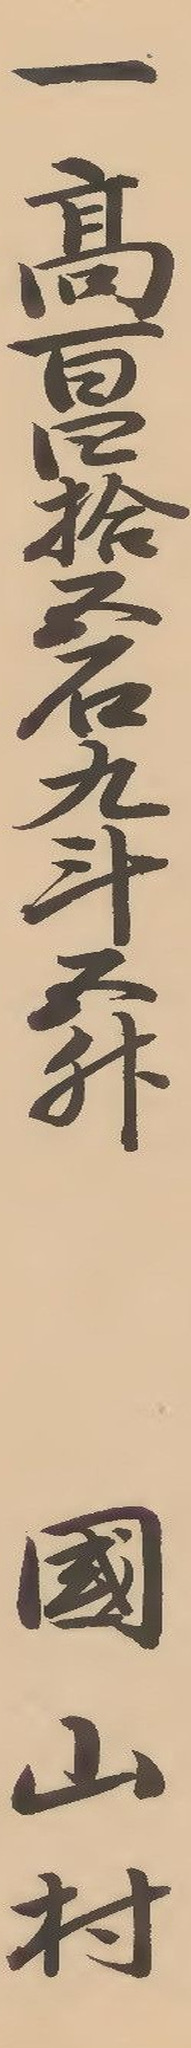一高百四拾五石九斗五升国山村

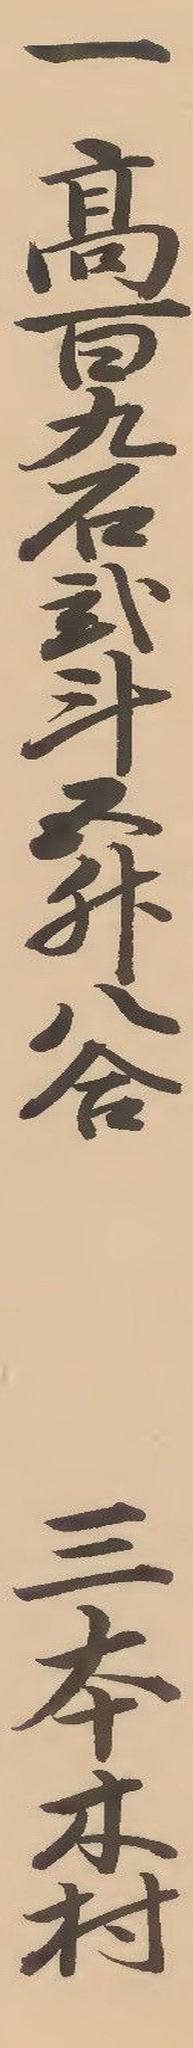一高百九石弐斗五升八合三本木村
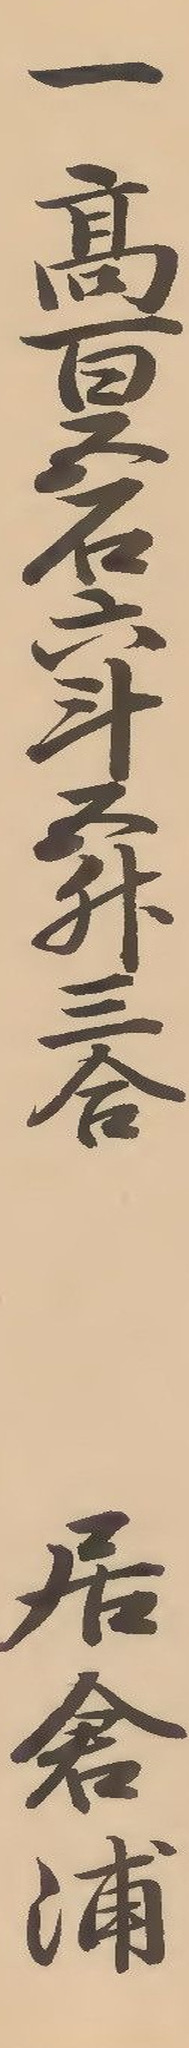一高百五石六斗五升三合居倉浦
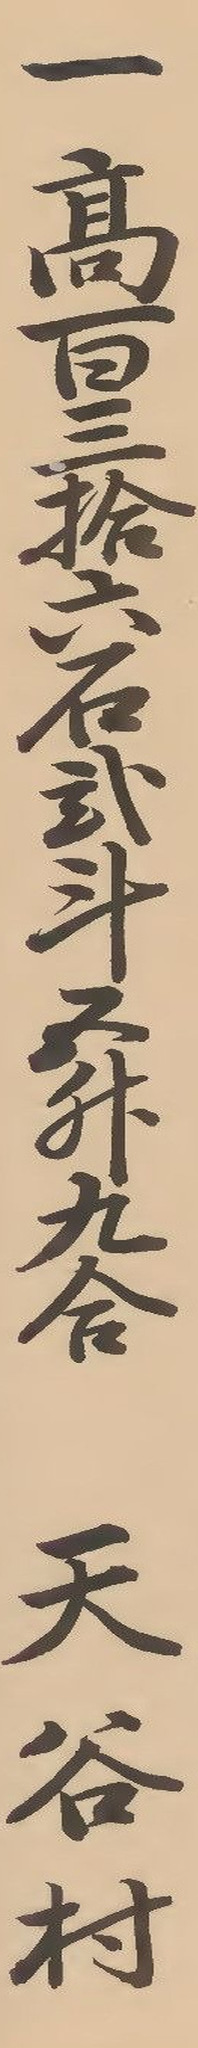一高百三拾六石弐斗五升九合天谷村
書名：越前国郷帳
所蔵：国立公文書館 National Archives of Japan
